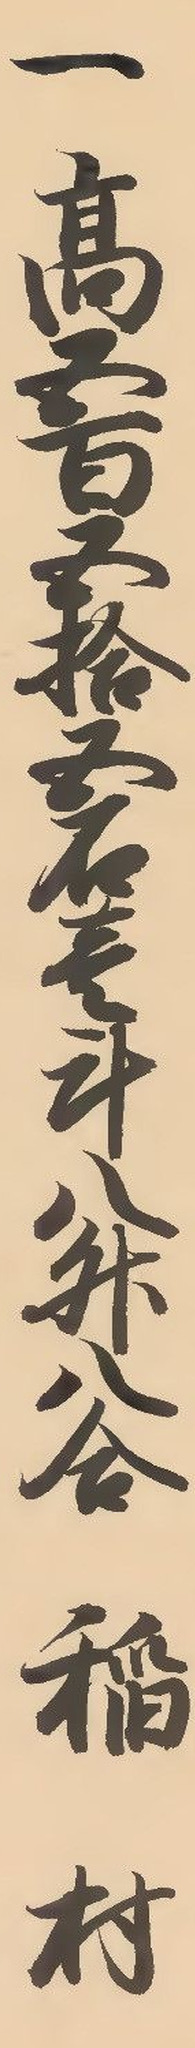一高五百五拾五石壱斗八升八合稲村
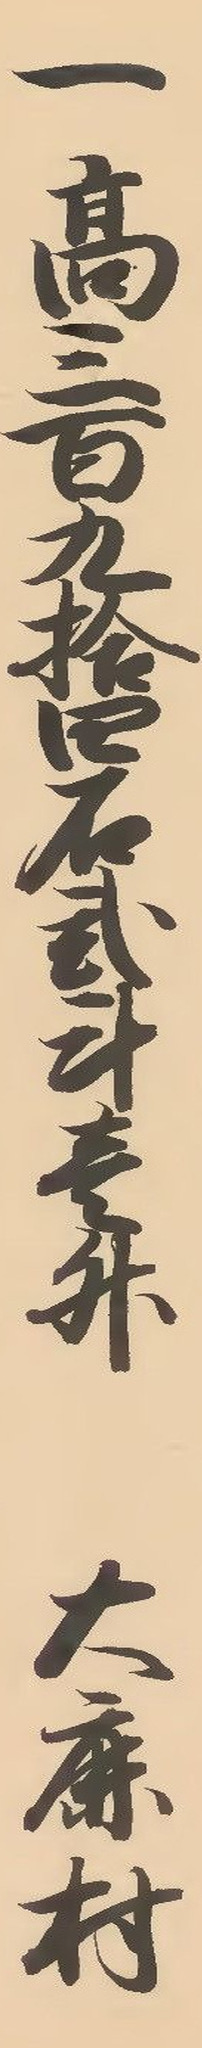一高三百九拾四石弐斗壱升大鹿村
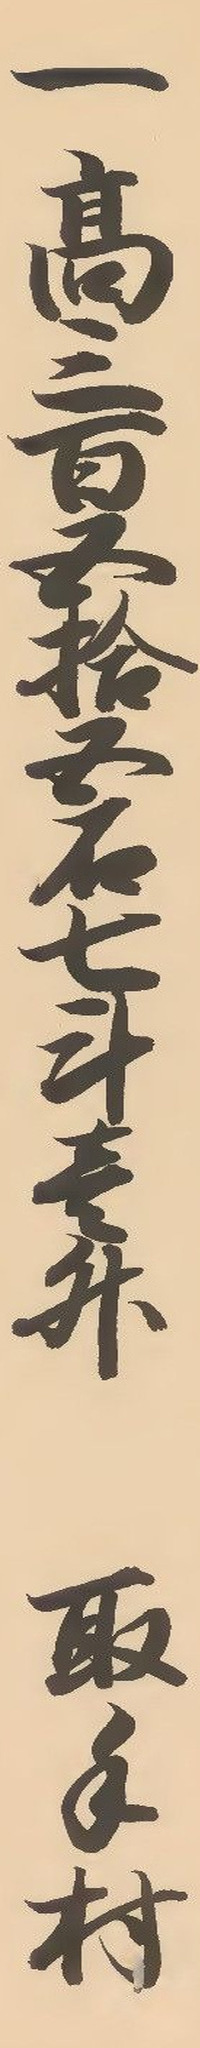一高三百五拾五石七斗壱升取手村
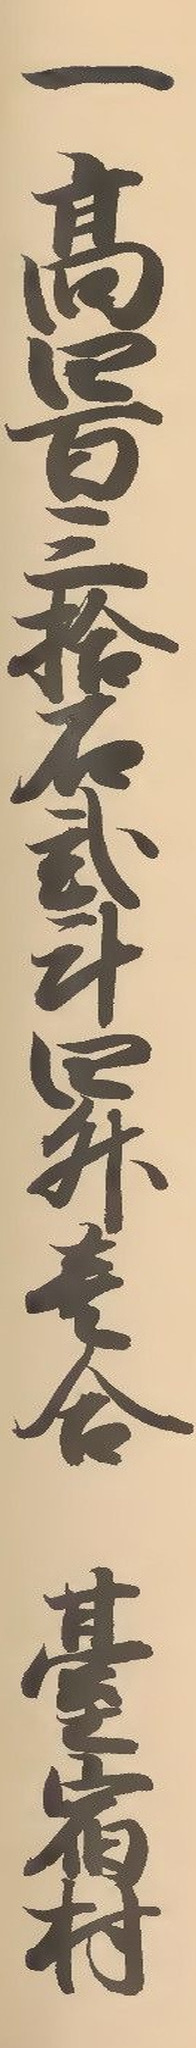一高四百三拾石弐斗四升壱合台宿村
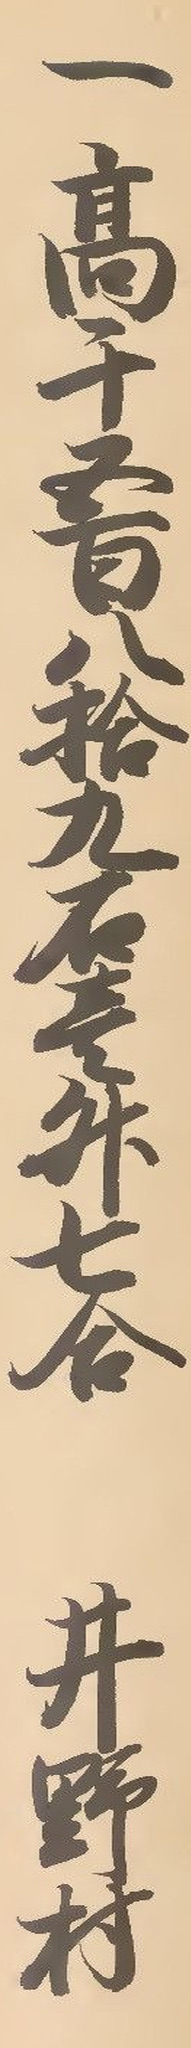一高千五百八拾九石壱升七合井野村
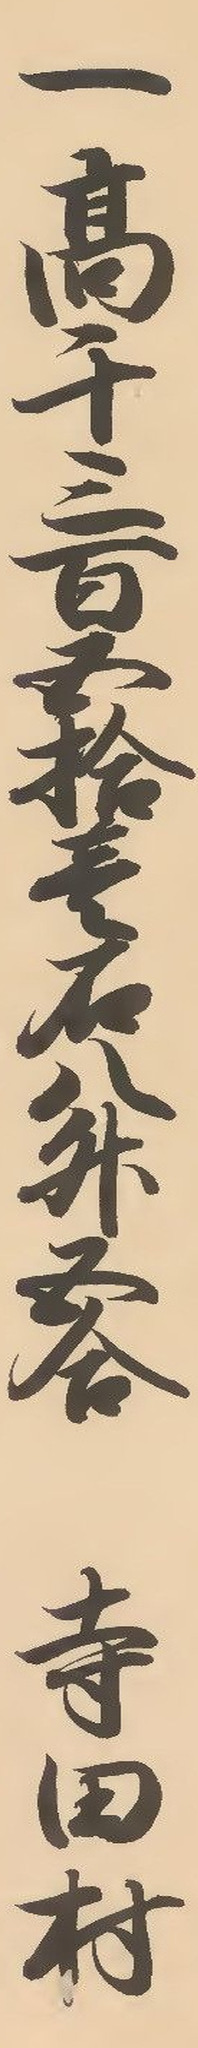一高千三百五拾壱石八升五合寺田村
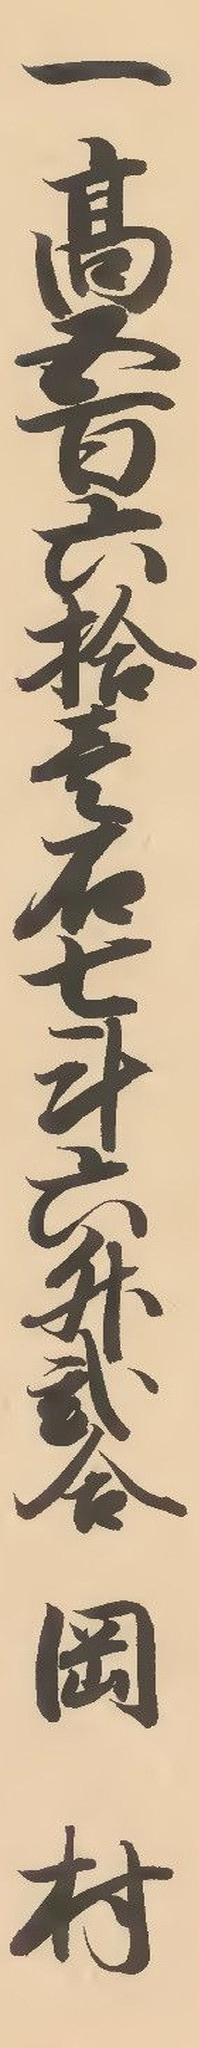一高五百六拾壱石七斗六升弐合岡村
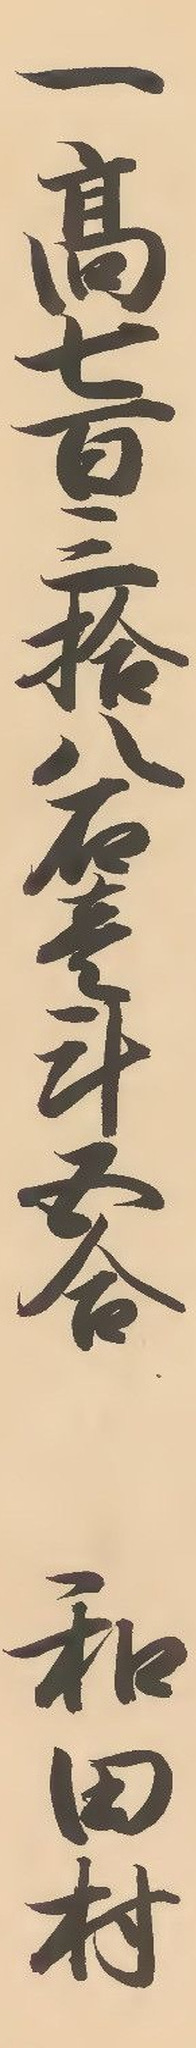一高七百三拾八石壱斗五合和田村

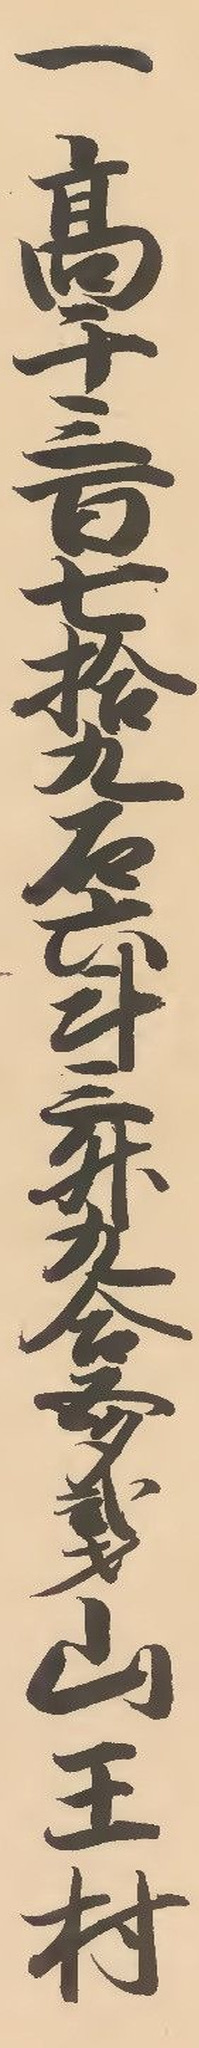一高千三百七拾九石六斗三升九合五勺弐才山王村
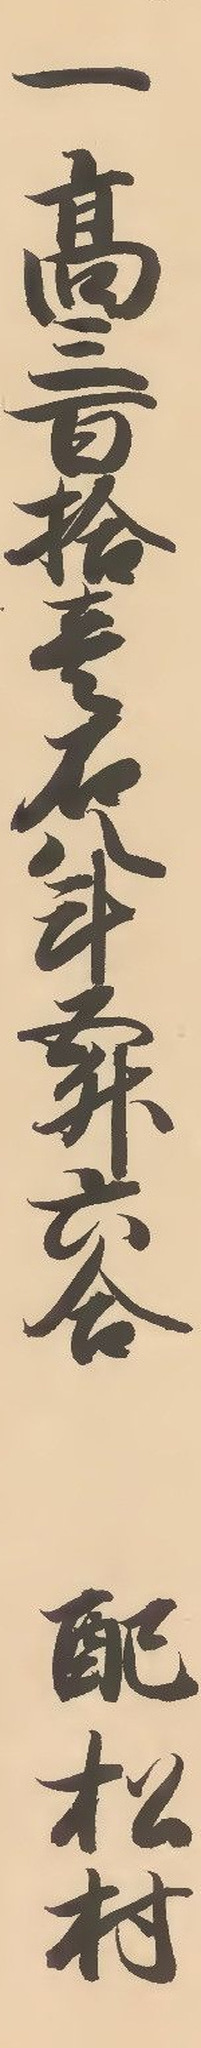一高三百拾壱石八斗五升六合配松村
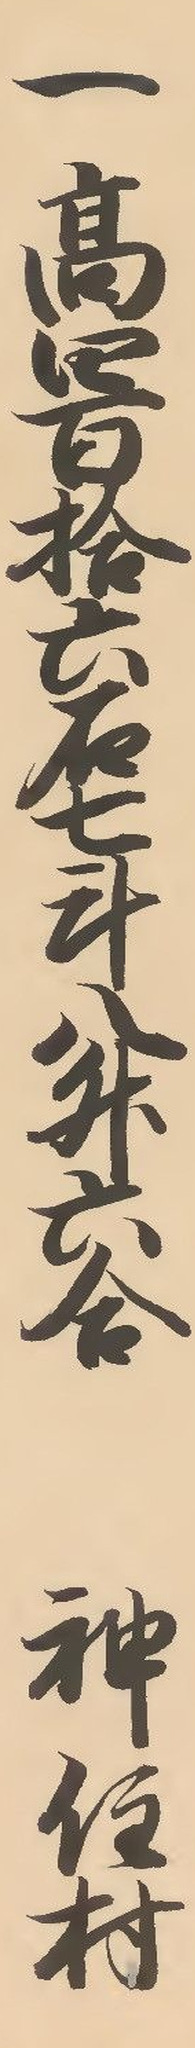一高四百拾六石七斗八升六合神住村
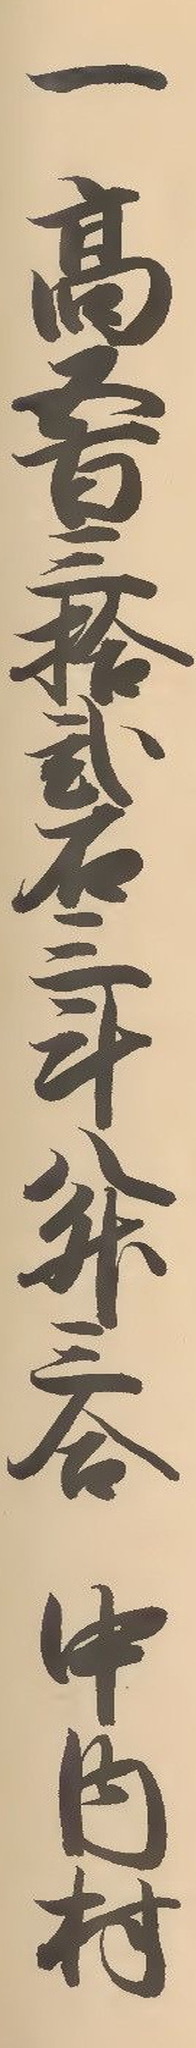一高五百三拾弐石三斗八升三合中内村
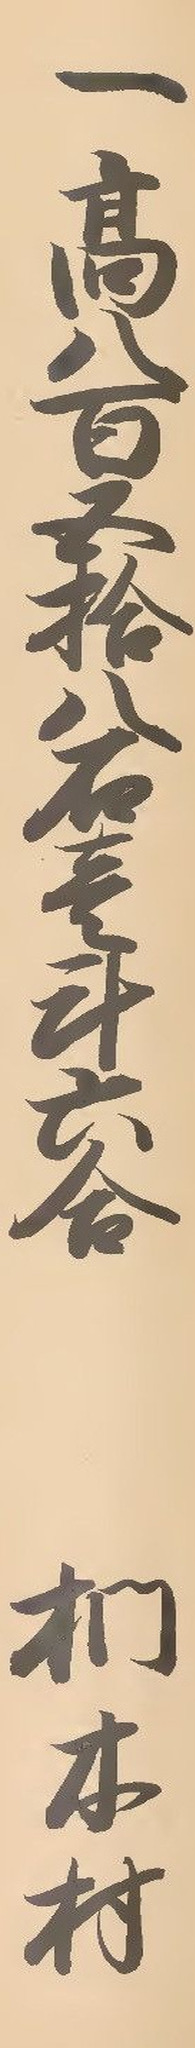一高八百五拾八石壱斗六合椚木村
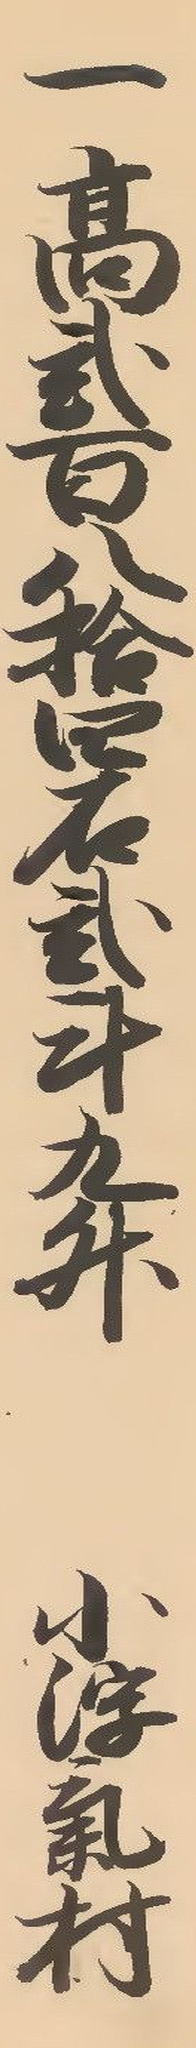一高弐百八拾四石弐斗九升小浮気村
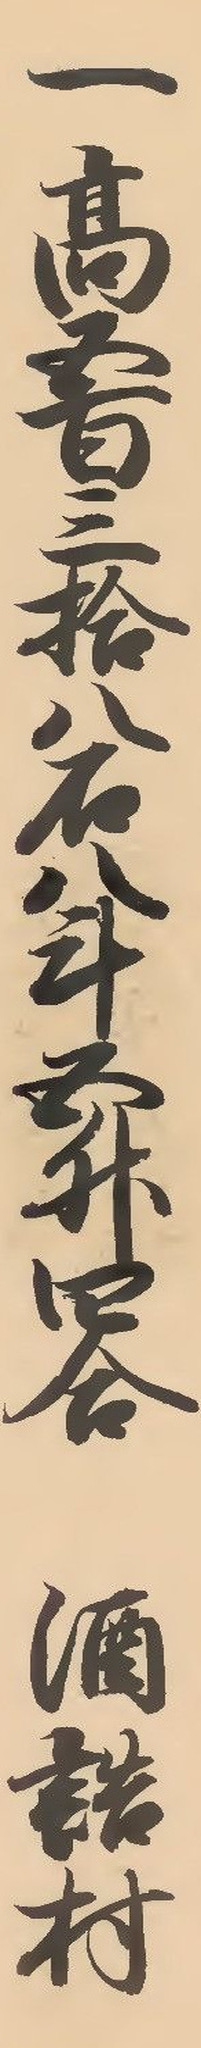一高五百三拾八石八斗五升四合酒詰村
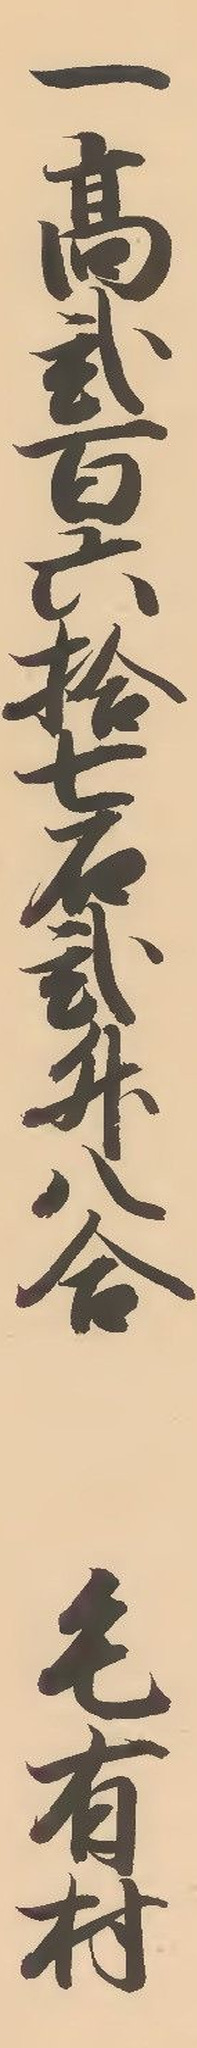一高弐百六拾七石弐升八合毛有村
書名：下総国郷帳
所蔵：国立公文書館 National Archives of Japan
